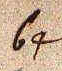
64
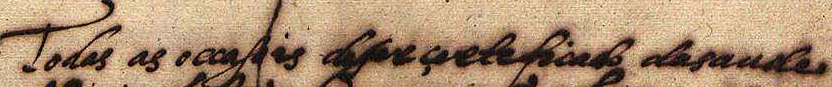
Todas as occasois de ser certeficado da saude
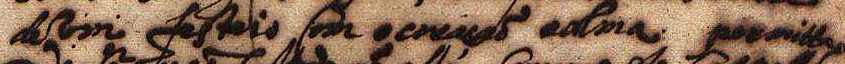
de vm festeio Com o coraçaõ e alma. permitta
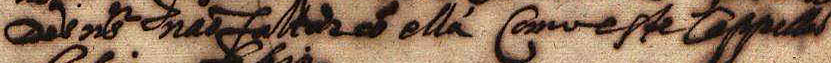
Dēs n sor naõ faltar cō ella Como este Cappelaõ
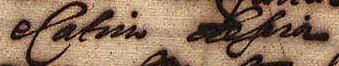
e Catiuo deseia
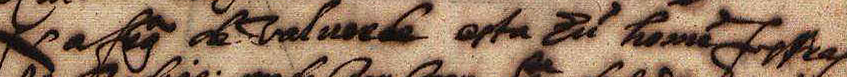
Na frga de Valuerde esta hū homē fostras
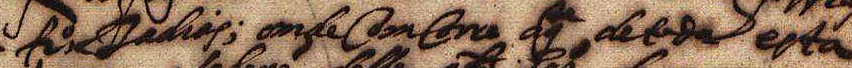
tro Ja dias; onde ComCorre a gte de toda esta
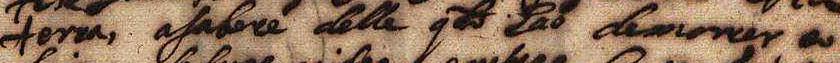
terra, a saberē delle q̄do haõ de morrer ao
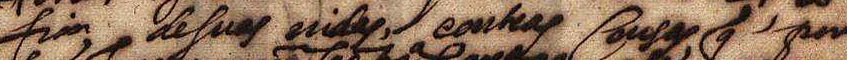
fim de suas uidas, e outras Cousas, q̄ por
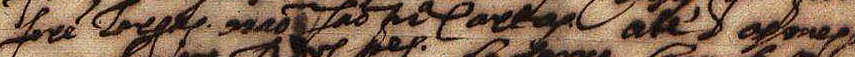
serē largas naõ saõ pra Cartas até os mes
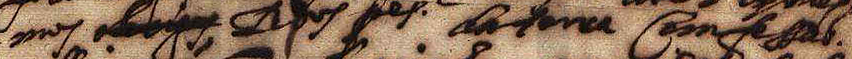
mos clerigos Rdos pes. da terra Comfessaõ.
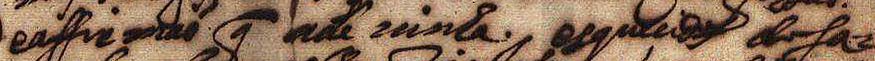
e affirmaõ q̄ adeuinha. esquecidos do sa
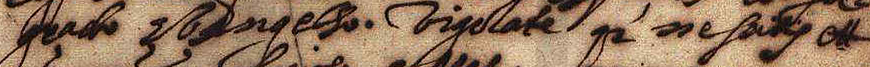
grado Evangelho. Vigelate qi ne seitis ett
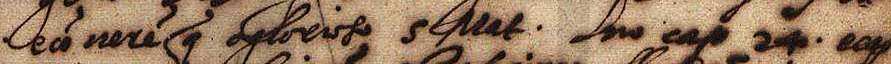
e cō uerē q̄ o glorioso s Mat. no cap 24. e cap
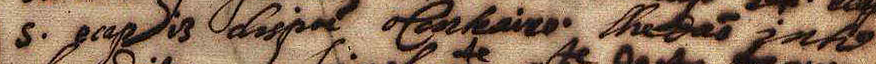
5. e cap i3 dispoẽ o Contrairo. lhe daõ intro
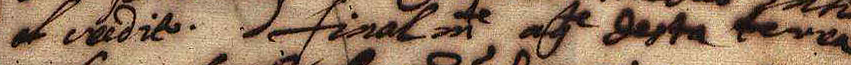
et credito. finalmte a gte desta terra
